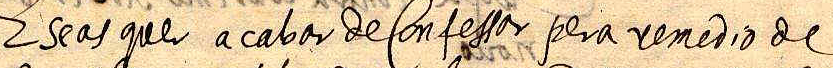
E se as quer acabar de Confessar pera remedio de
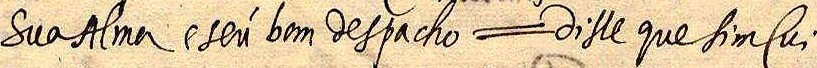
sua Alma e seú bom despacho == disse que sim Cui
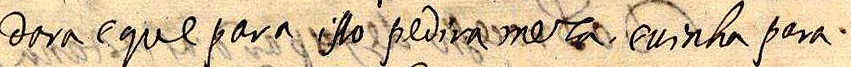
dara e que para isso pedira meza. e uinha para
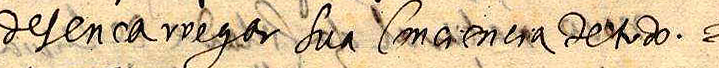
desencarregar sua Conciencia de todo.
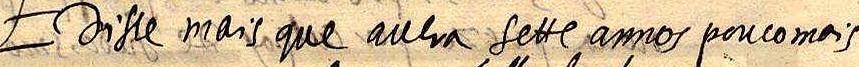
E disse mais que auera sette annos pouco mais
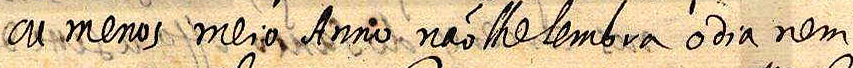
ou menos meio Anno naõ lhe lembra o dia nem
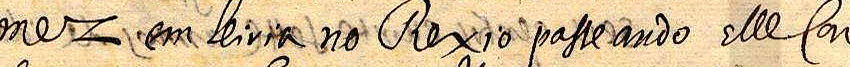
mez em leiria no Rexio passeando Elle Con
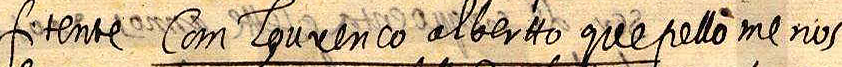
fitente Com Lourenco albertto que pello menos
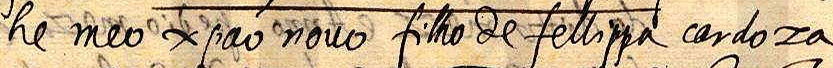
he meo xpaõ nouo filho de fellippa cardoza
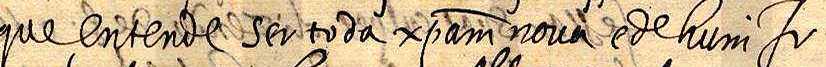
que entende ser toda xp̄am noua e de hum Jr
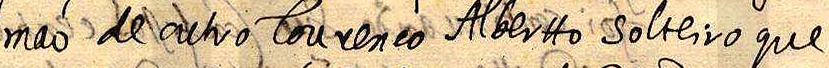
maõ de outro lourenco Albertto solteiro que
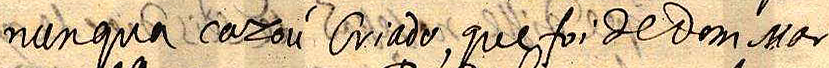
nunqua cazou Criado, que foi de Dom Mar
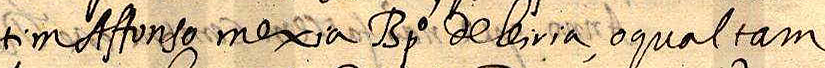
tim Affonso mexia Bpo de leiria, o qual tam
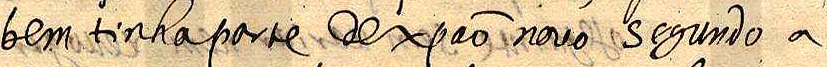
bem tinha parte de xpaõ nouo segundo a
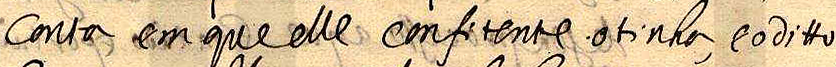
conta em que elle confitente o tinha, e o ditto
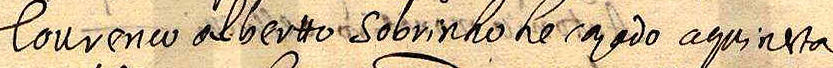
lourenco albertto sobrinho he cazado aqui nesta
